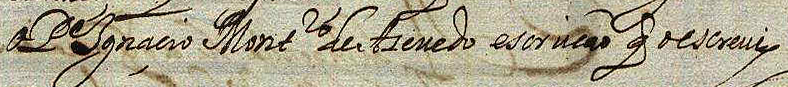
o Pe Ignacio Montro de Azeuedo escriuaõ q̄ o escreui
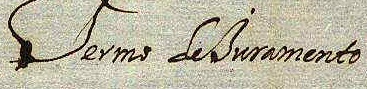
Termo de Iuramento
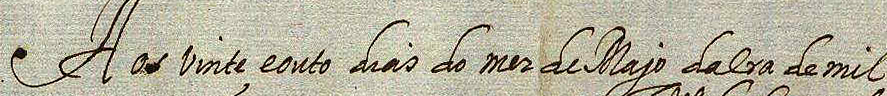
Aos vinte e outo dias do mez de Majo da era de mil
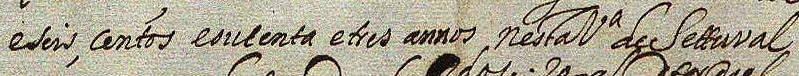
e seiscentos e outenta e tres annos nesta Va de Settuval
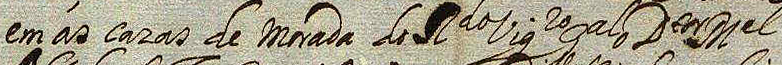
em as cazas de morada do Rdo Vigro Gal o Dtor Mel
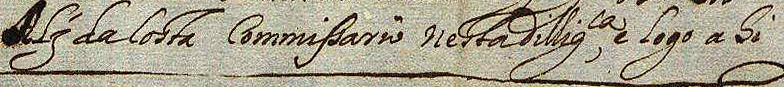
Alz̄ da Costa Commissario nesta dilligca, e logo ahi
